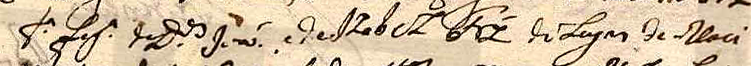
f.a Leg.a de D.os Joaõ de Izabel Frz̄ do Lugar de Maci
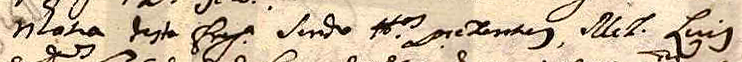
nhota desta freg.a sendo tt.as prezentes Mel. Luis
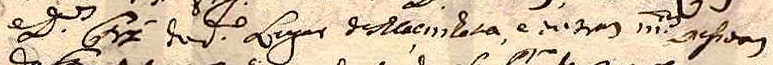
e D.os Frz̄ do d.to Lugar de Macinhota, e outras m.tas pessoas
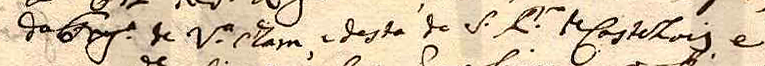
da Freg.a de V.a cham e desta de S. P.o de CasteLois, e
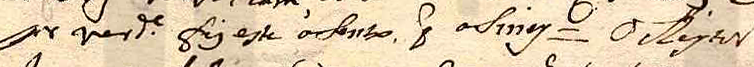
por verd.e fis este asento q̄ asiney = O Reytor
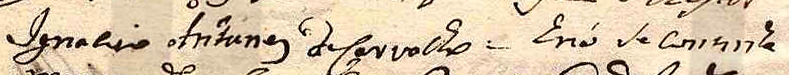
Ignacio Antunes de Carvalho = E naõ se continha
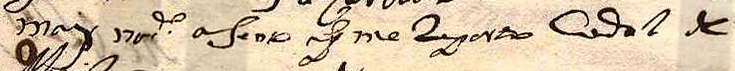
mais no d.o asento a q̄ me Reporto Codal de
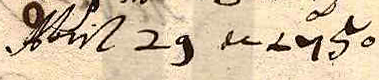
Abril 29 de 1750
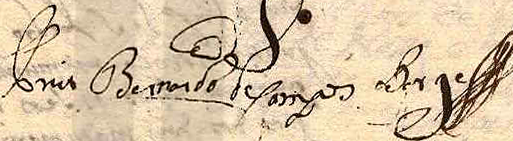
Prior Bernardo de Campos Borges
